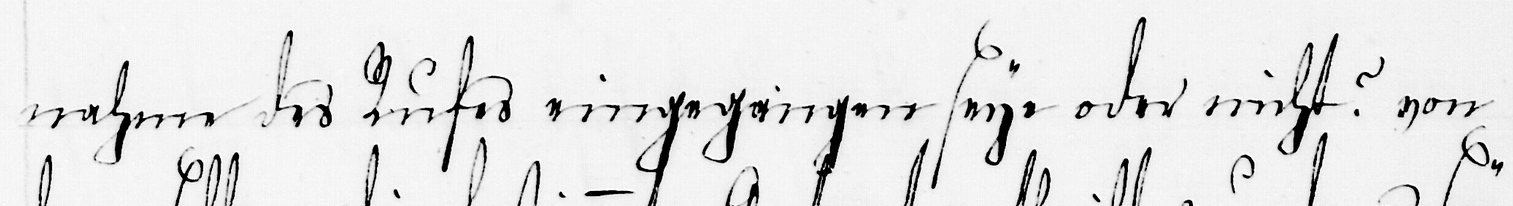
nahme des Rufes eingegangen seye oder nicht? von
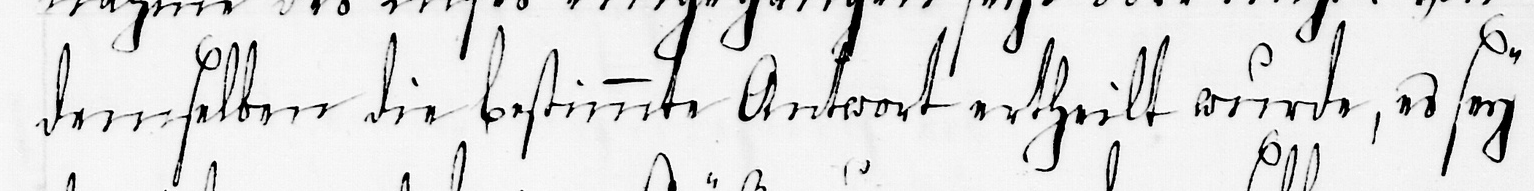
demselben die bestimmte Antwort ertheilt wurde, es sey
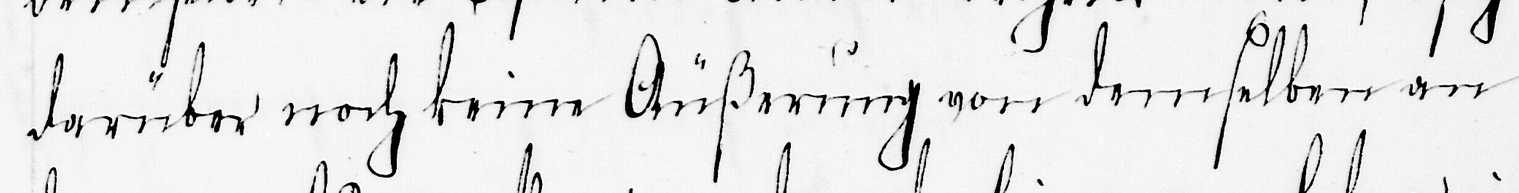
darüber noch keine Äußerung von demselben an
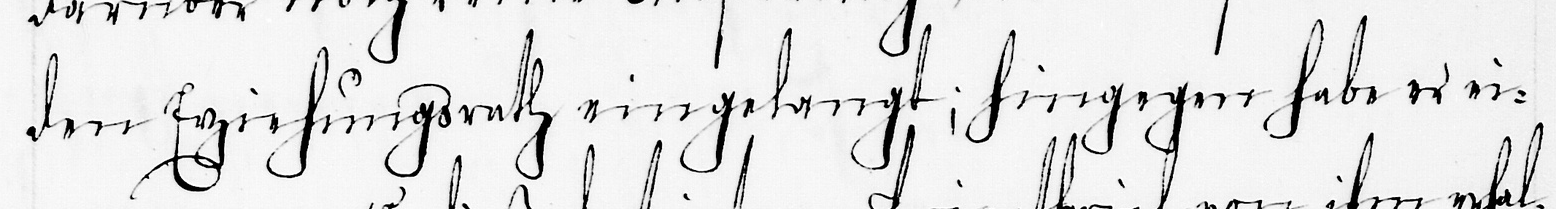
den Erziehungsrath eingelangt; hingegen habe er ei¬
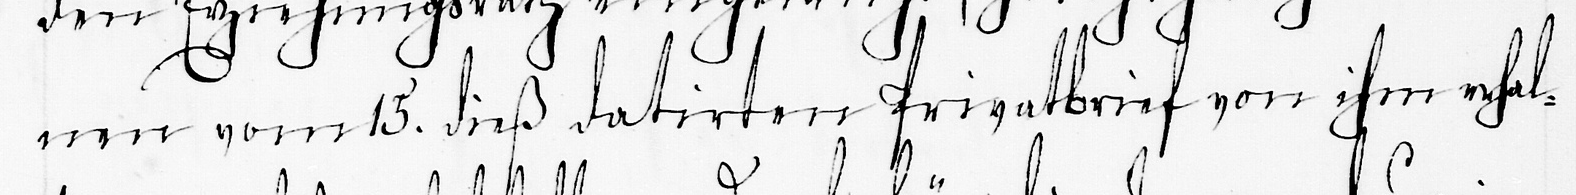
nen vom 15. dieß datirten Privatbrief von ihm erhal¬
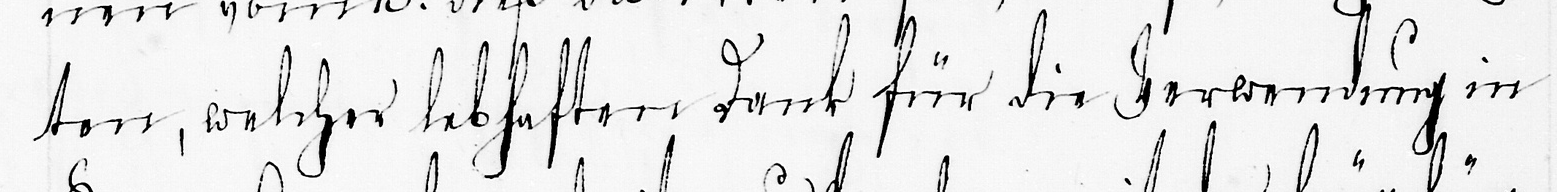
ten, welcher lebhaften Dank für die Verwendung in
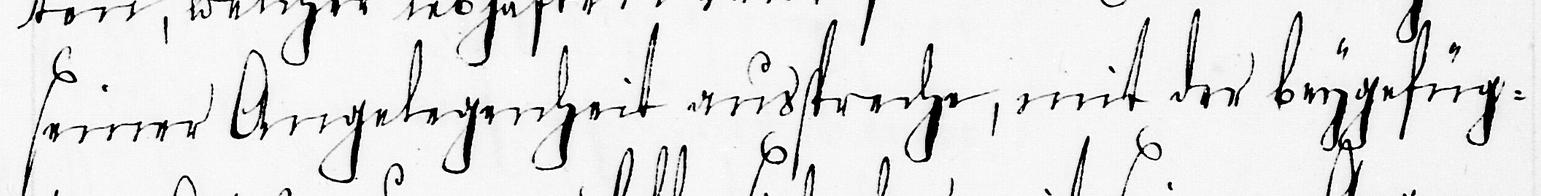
seiner Angelegenheit ausspreche, mit der beygefüg¬
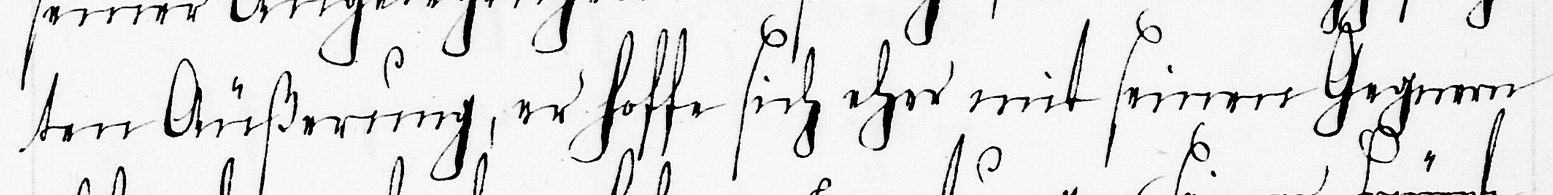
ten Äußerung, er hoffe sich eher mit seinen Gegnern
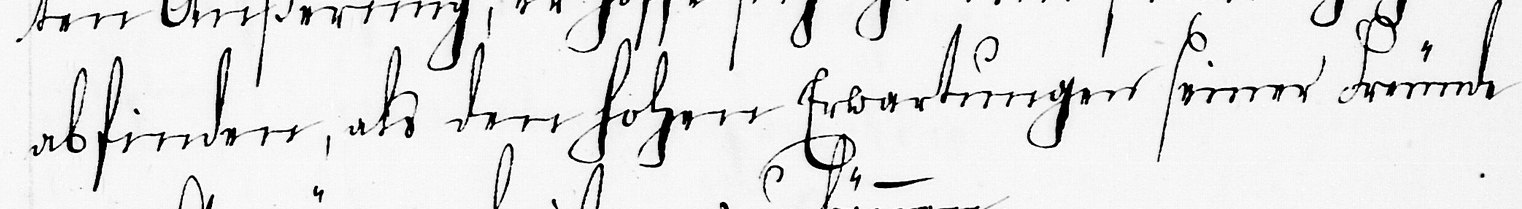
abfinden, als den hohen Erwartungen seiner Freunde
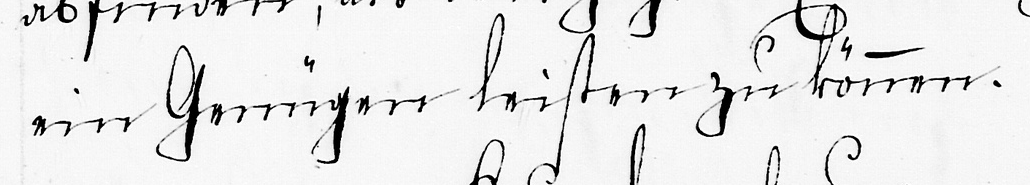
ein Genügen leisten zu können.
